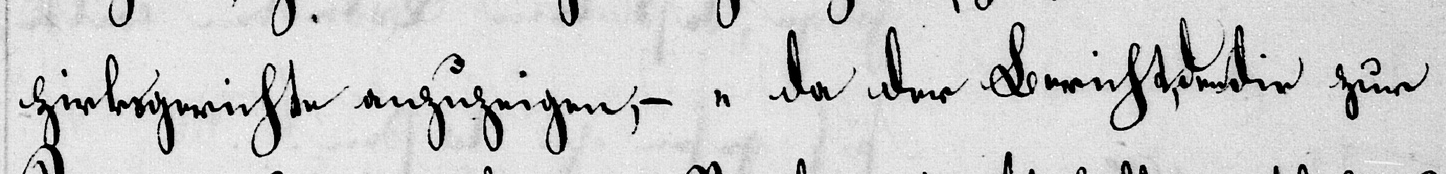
zirksgerichte anzuzeigen, – da der Bericht, den die zur
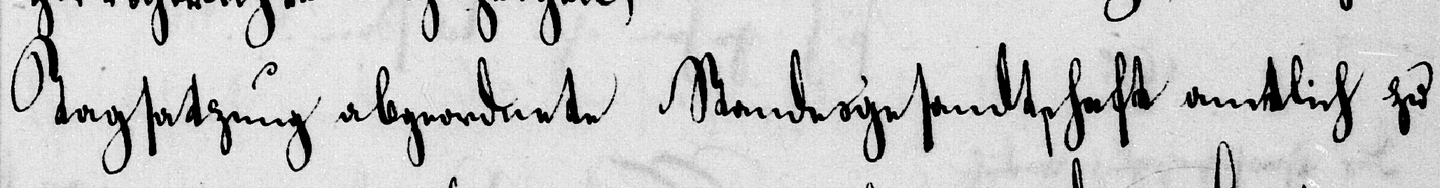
Tagsatzung abgeordnete Standesgesandtschaft amtlich zu
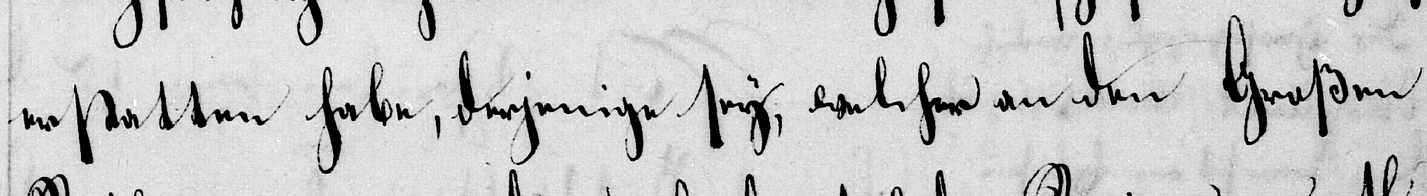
erstatten habe, derjenige sey, welcher an den Großen
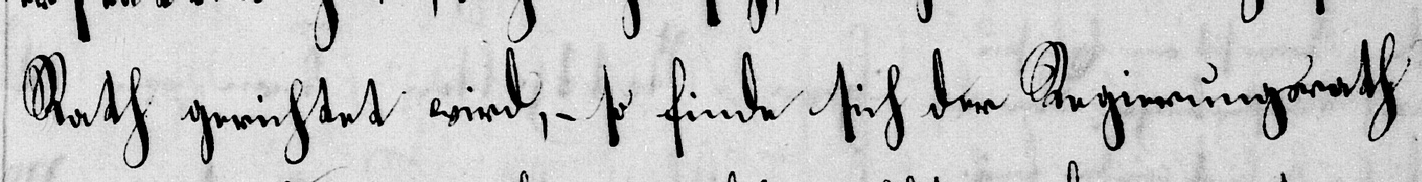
Rath gerichtet wird, – so finde sich der Regierungsrath
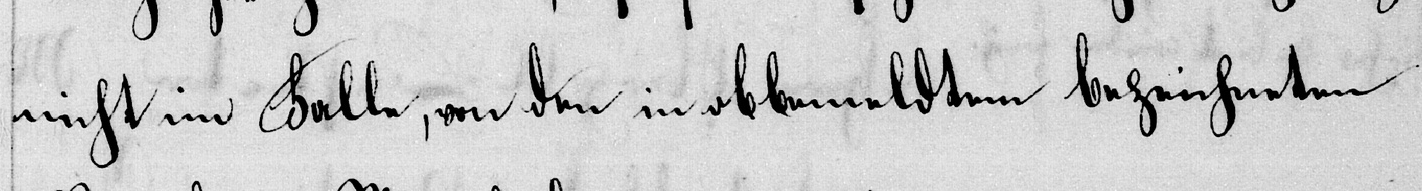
nicht im Falle, von den in obbemeldten bezeichneten
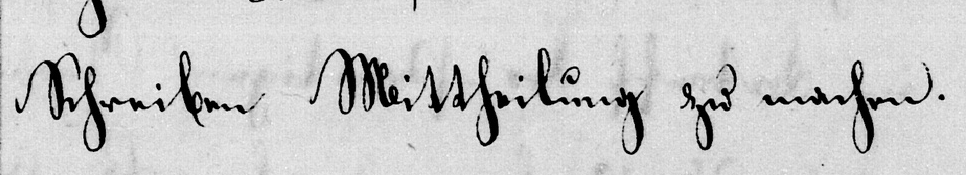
Schreiben Mittheilung zu machen.
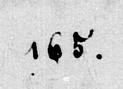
15.
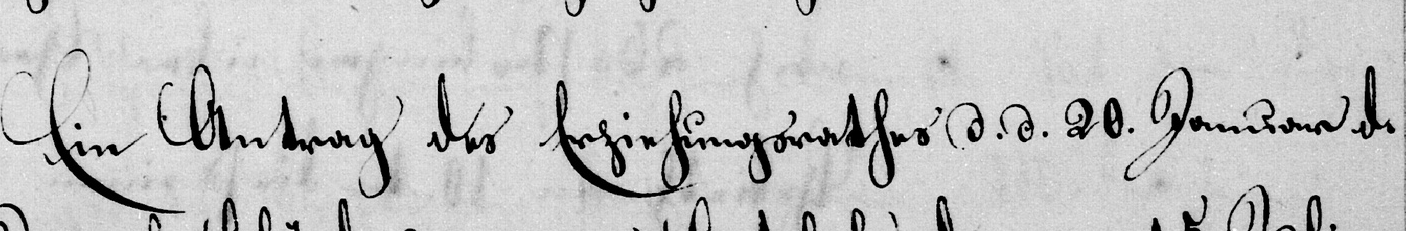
Ein Antrag des Erziehungsrathes d. d. 20. Januar d.
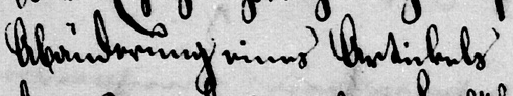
Abänderung eines Artikels
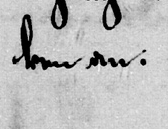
der am
